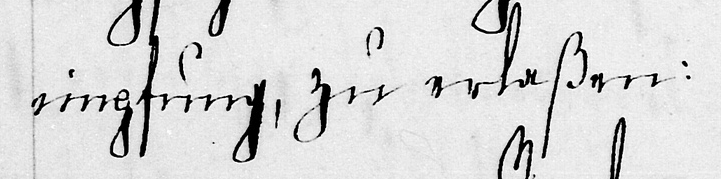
enimpfung zu erlaßen:
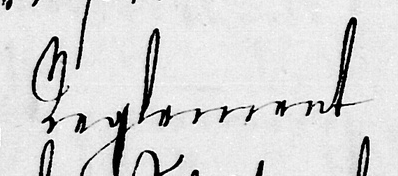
Reglement
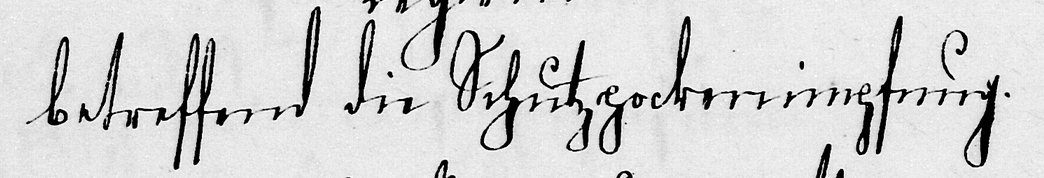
betreffend die Schutzpockenimpfung.
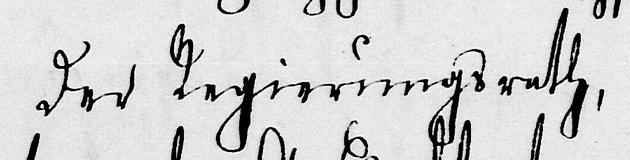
Der Regierungsrath,
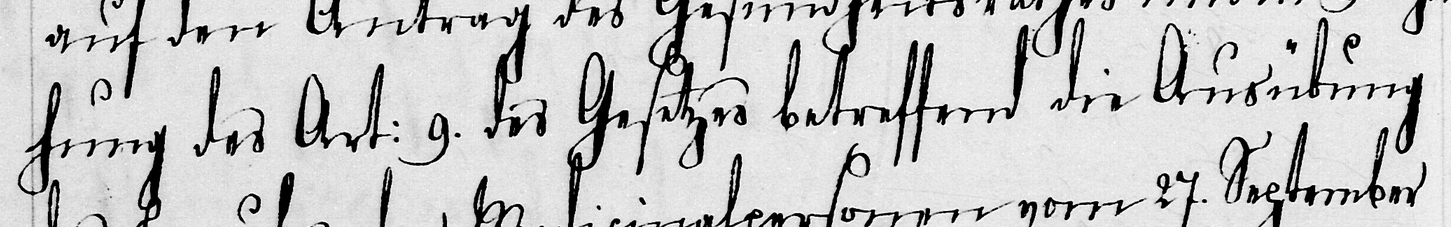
hung des Art: 9. des Gesetzes betreffend die Ausübung
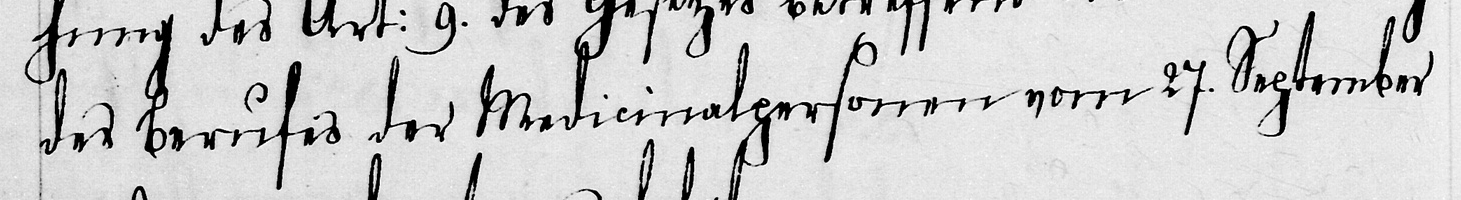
des Berufes der Medicinalpersonen vom 27. September
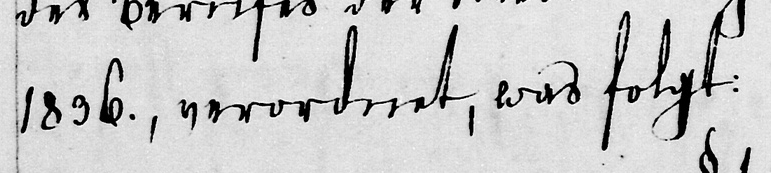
1836., verordnet, was folgt:
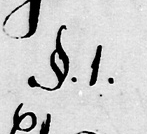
§. 1.
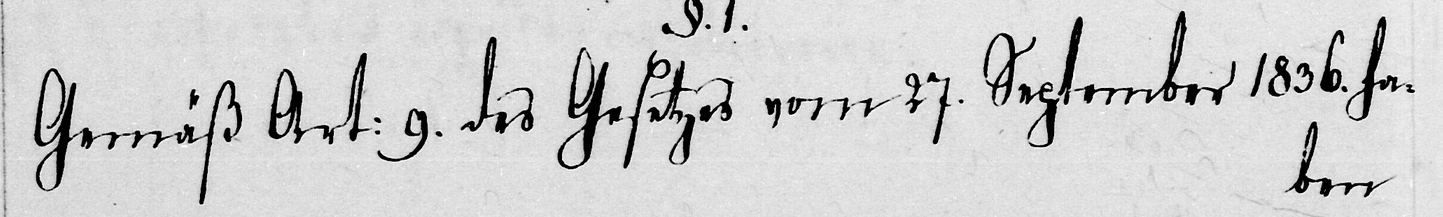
Gemäß Art: 9 des Gesetzes vom 27. September 1836. ha-
